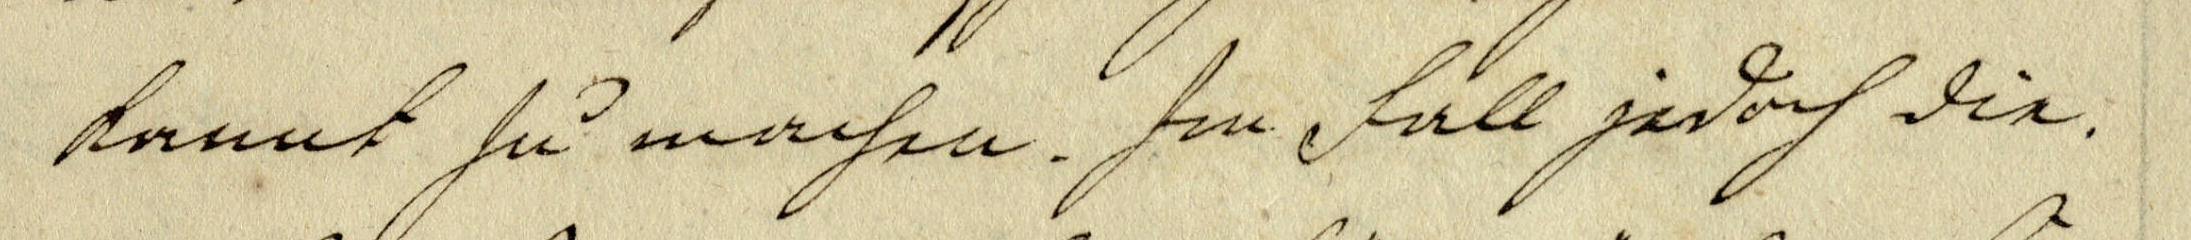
kannt zu machen. Im Fall jedoch die¬
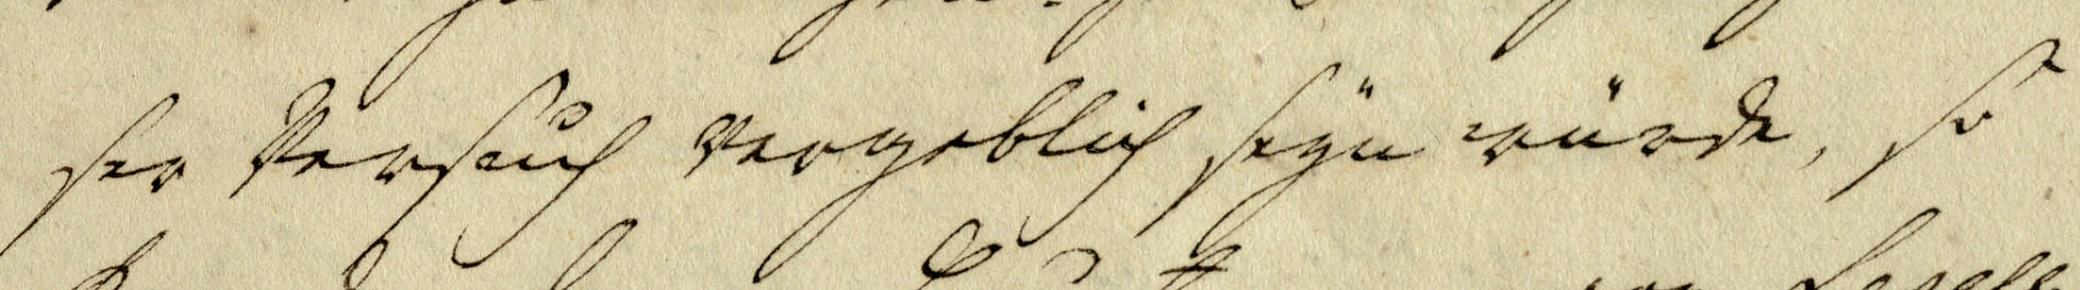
ser Versuch vergeblich seÿn würde, so
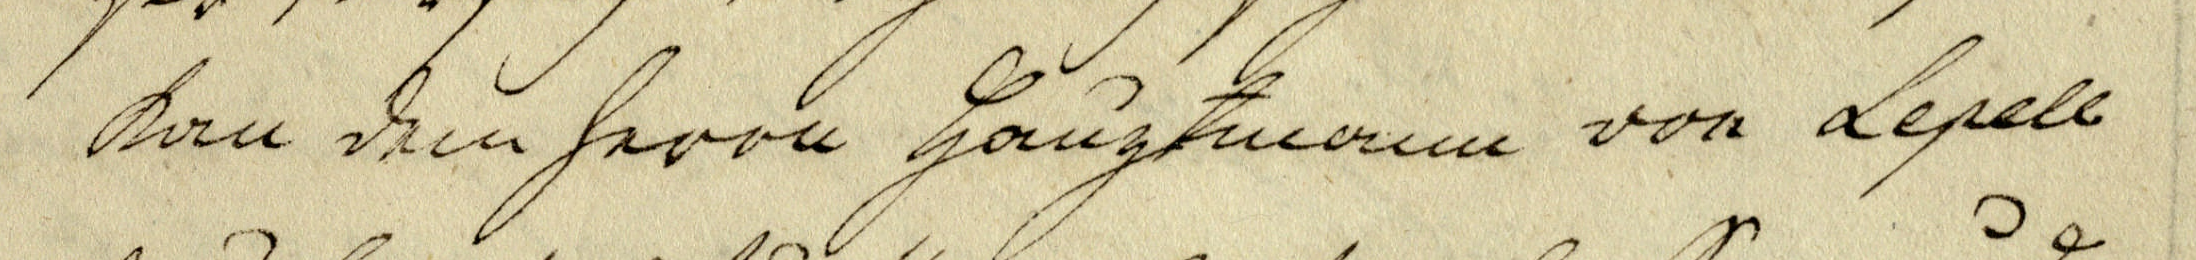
kan dem Herrn Hauptmann von Lepell
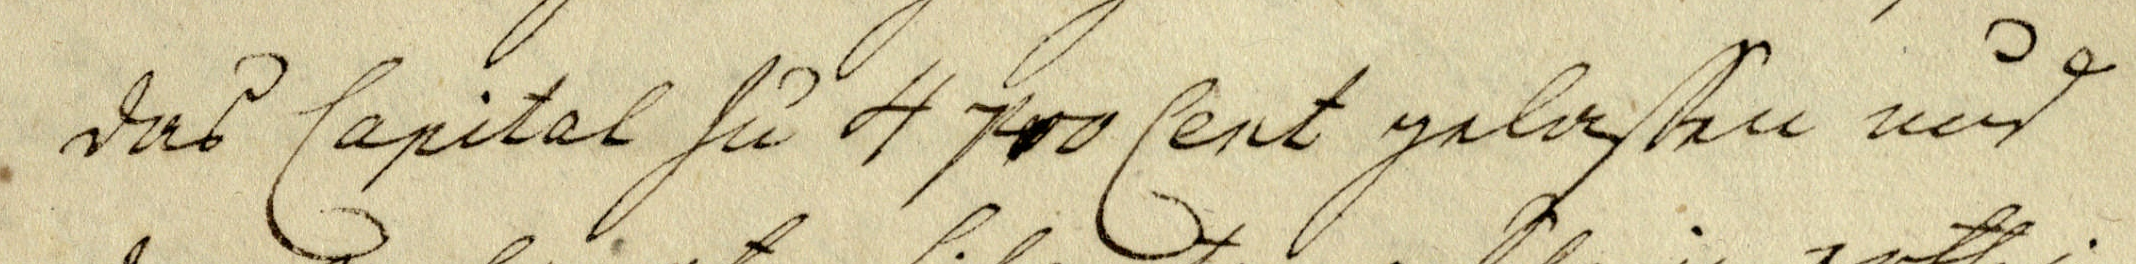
das Capital zu 4 pro cent gelassen und
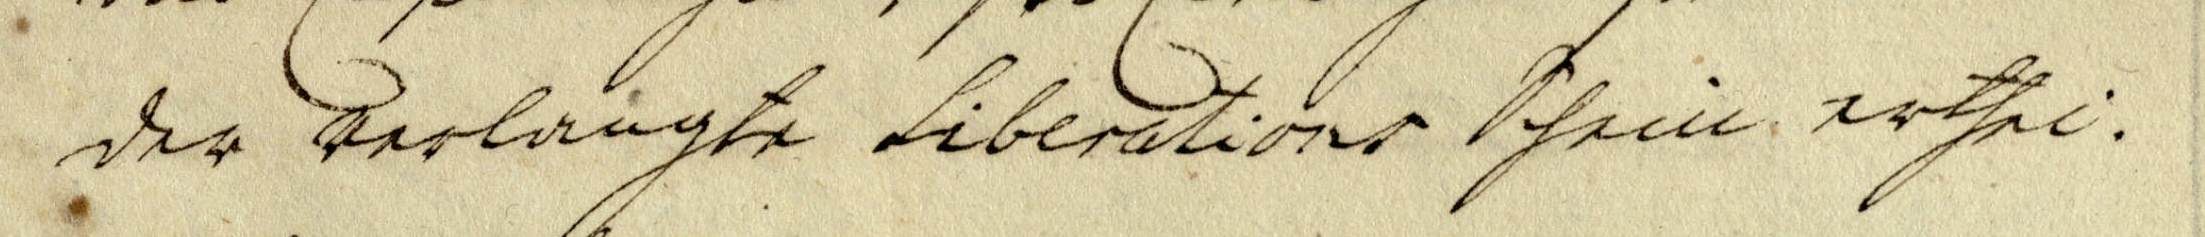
der verlangte Liberations Schein erthei¬
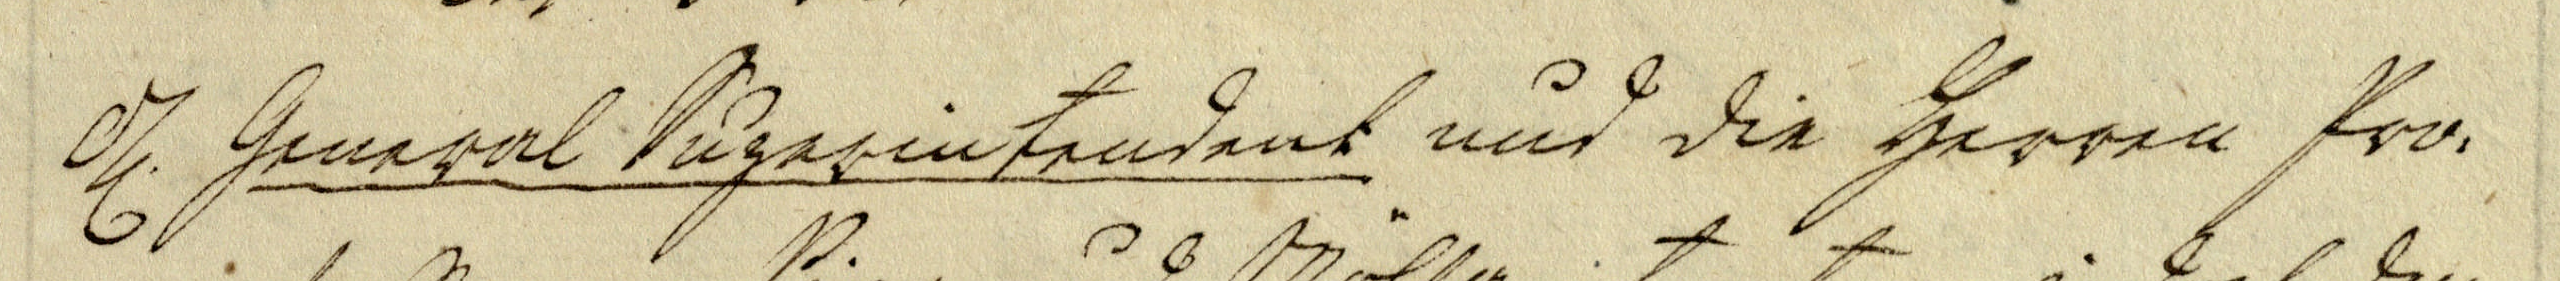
dh. General Superintendent und die Herren Prof¬
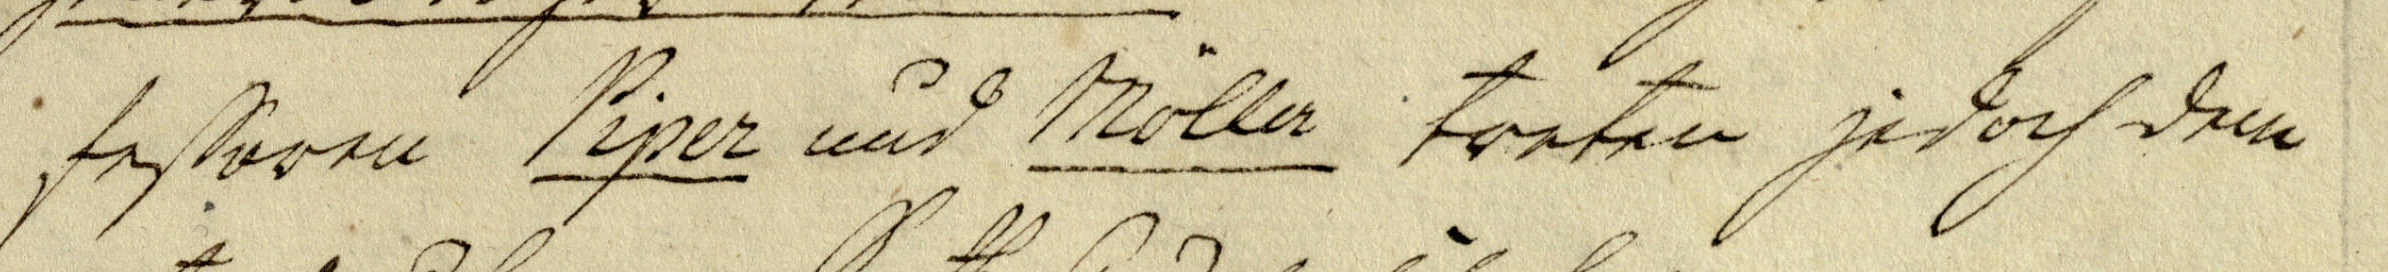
fessoren Piper und Möller treten jedoch dem
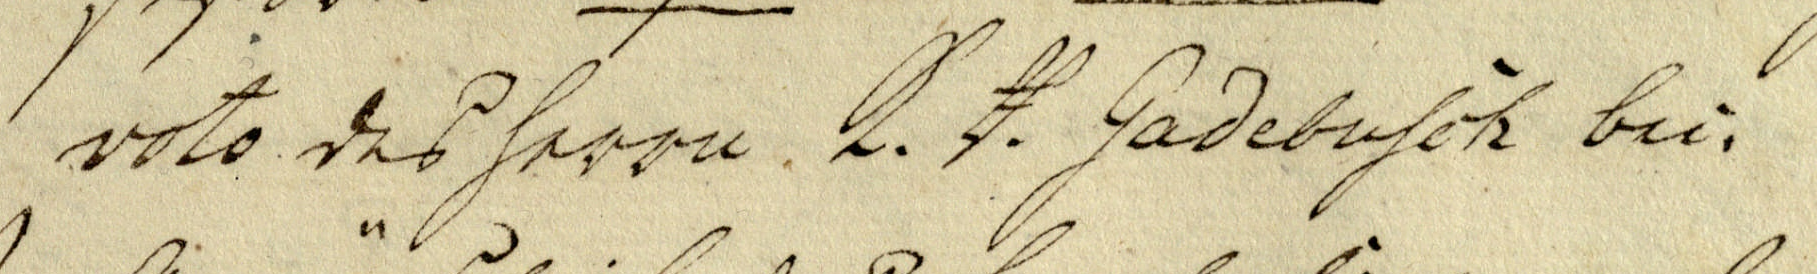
voto des Herrn K. R. Gadebusch bei.
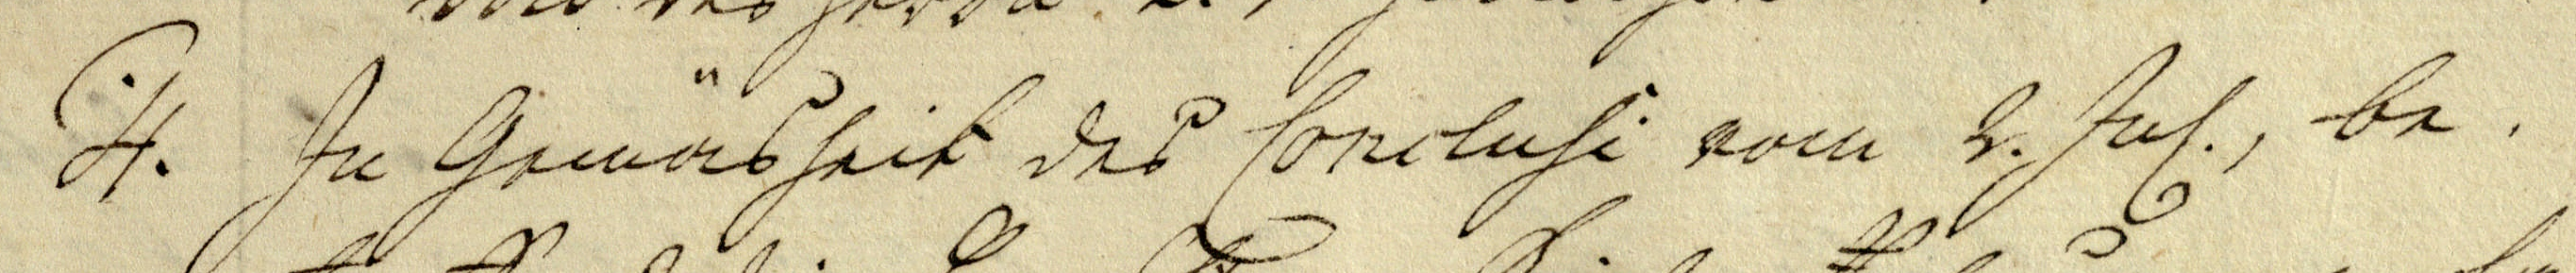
4. In Gemäsheit des Conclusi vom 2. Jul., be¬
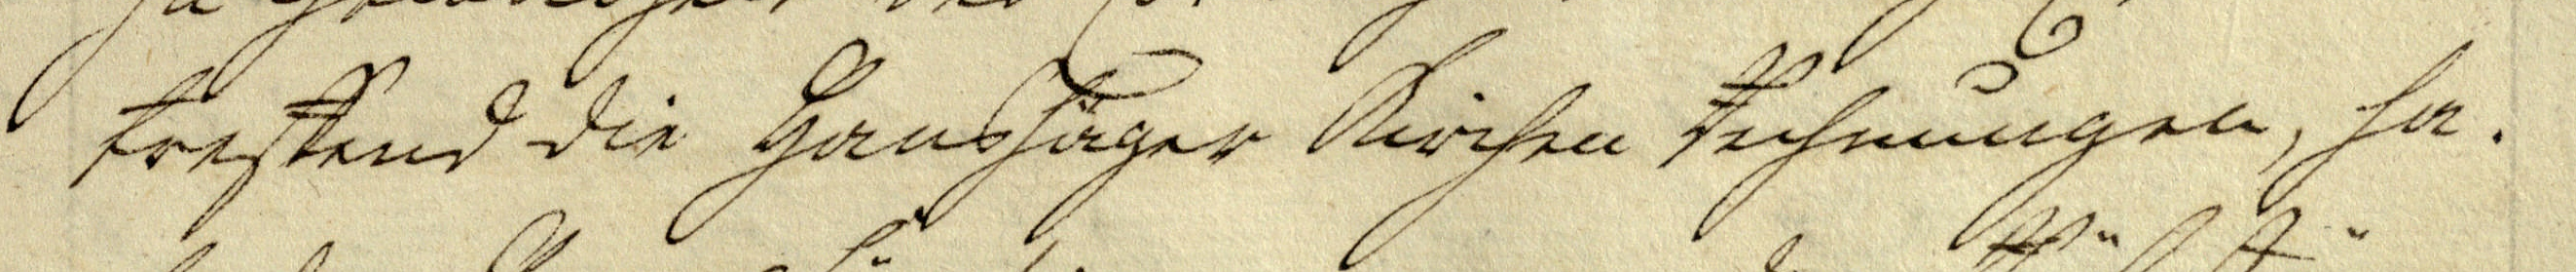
treffend die Hanshäger Kirchen Rechnungen, ha¬
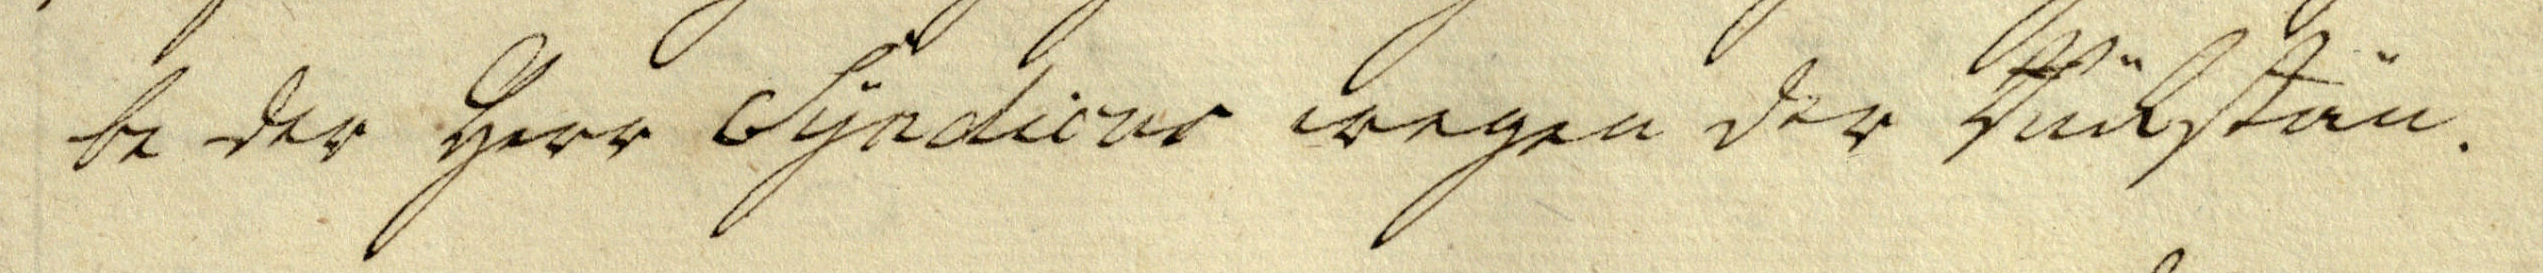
be der Herr Sÿndicus wegen der Rückstän¬
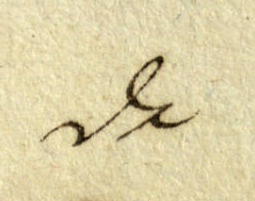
de
